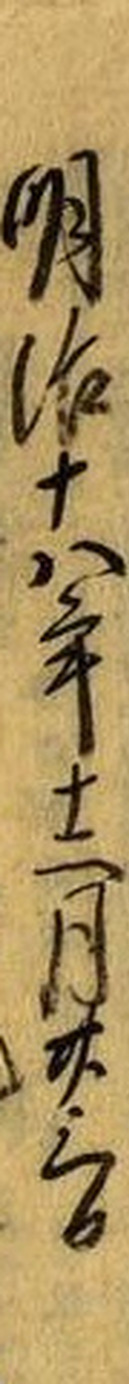明治十八年十二月廿三日
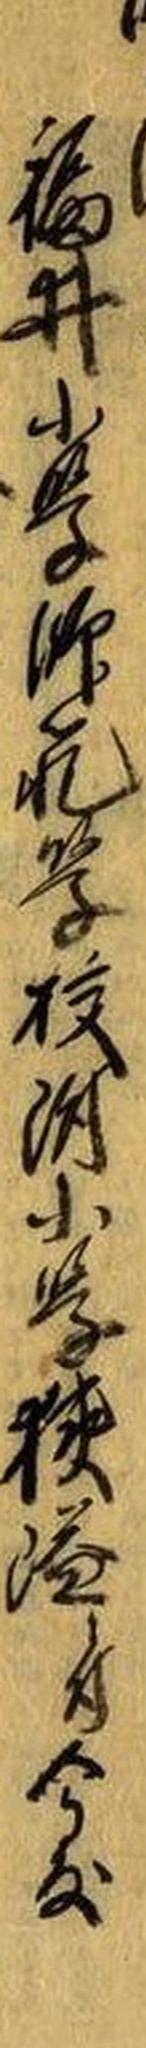福井小学師範学校附小学狭隘に付今度
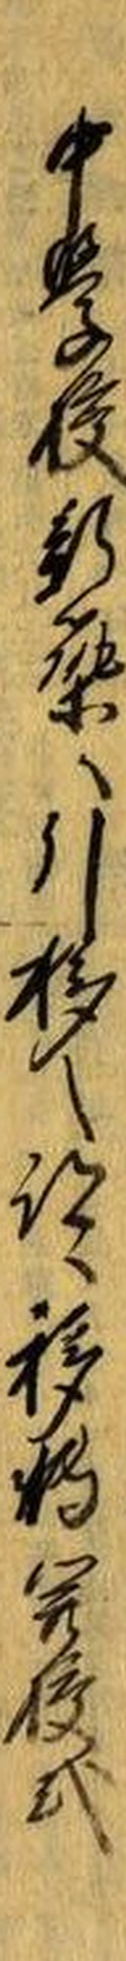中学校新築へ引移之跡へ移転開校式
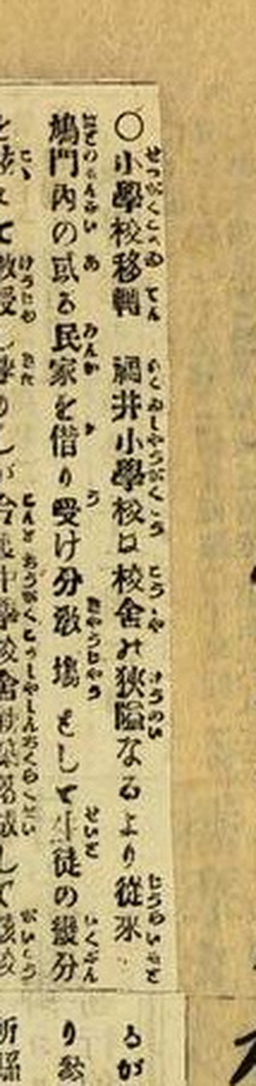〇小学校移転福井小学校は校舎の狭隘なるより従来元
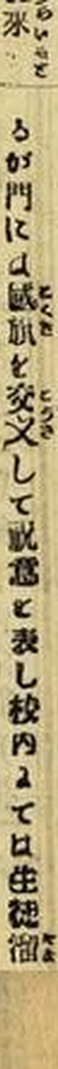るが門には国旗を交叉して祝意を表し校内にては生徒溜
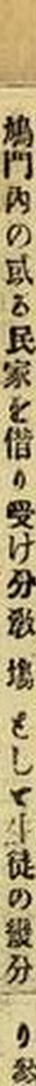鳩門内の或る民家を借り受け分教場として生徒の幾分
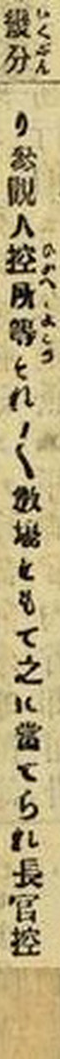り参観人控所等それ〳〵教場をもて之に当てられ長官控
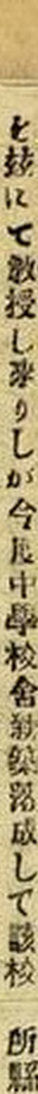を茲にて教授し来りしが今度中学校舎新築落成して該校
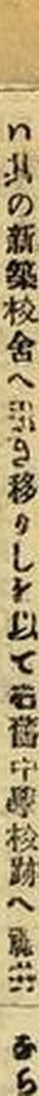は其の新築校舎へ引き移りしを以て右旧中学校跡へ福井
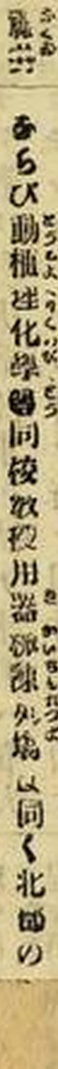ならび動植理化学等同校教授用器械陳列場は同く北部の
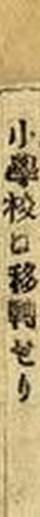小学校は移転せり
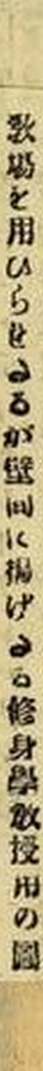教場を用ひられたるが壁面に掲げたる修身学教授用の図
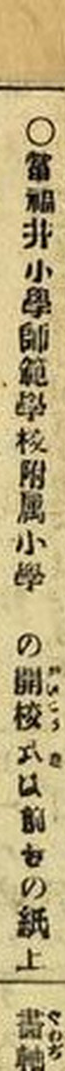〇当福井小学師範学校附属小学の開校式は前号の紙上
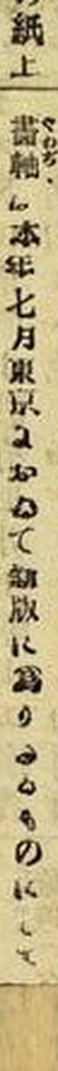画軸は本年七月東京におゐて初版に為りたるものにして
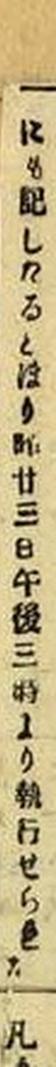にも記したるとほり昨廿三日午後三時より執行せられ
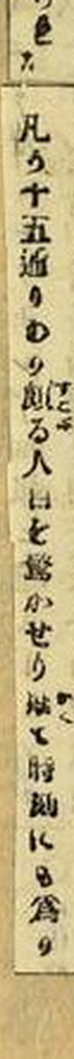凡そ十五通りあり頗る人目を驚かせり斯て時刻にも為り
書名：温古集 五巻
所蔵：福井県文書館 Fukui Prefectural Archives
